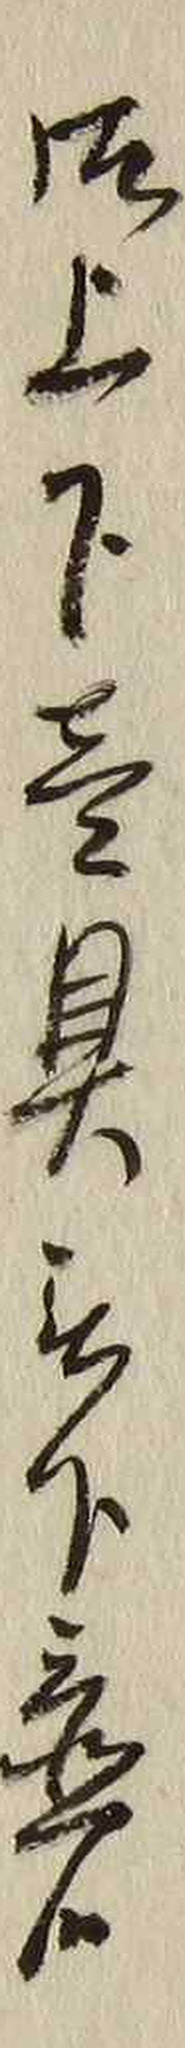御上下壱具被下置候
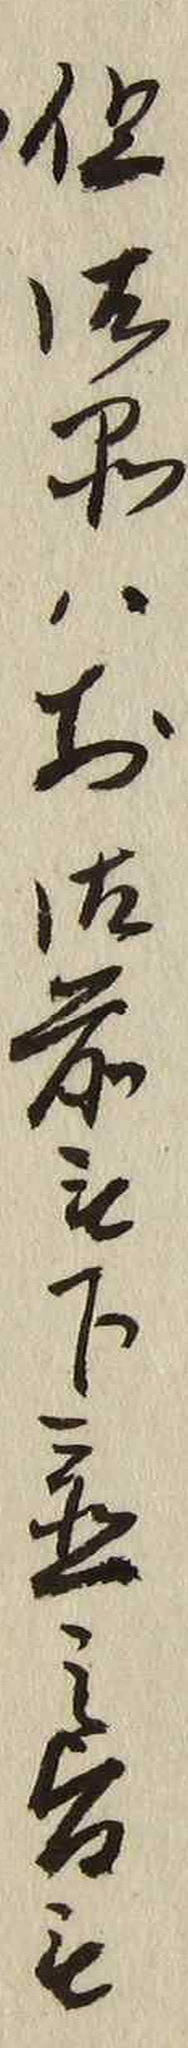但御品ハ於御前被下置之旨被
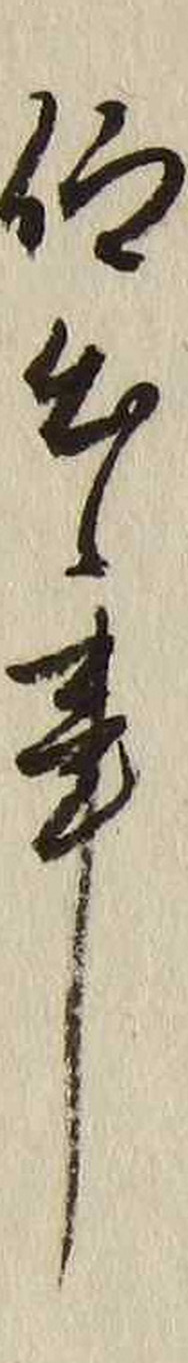仰出候事
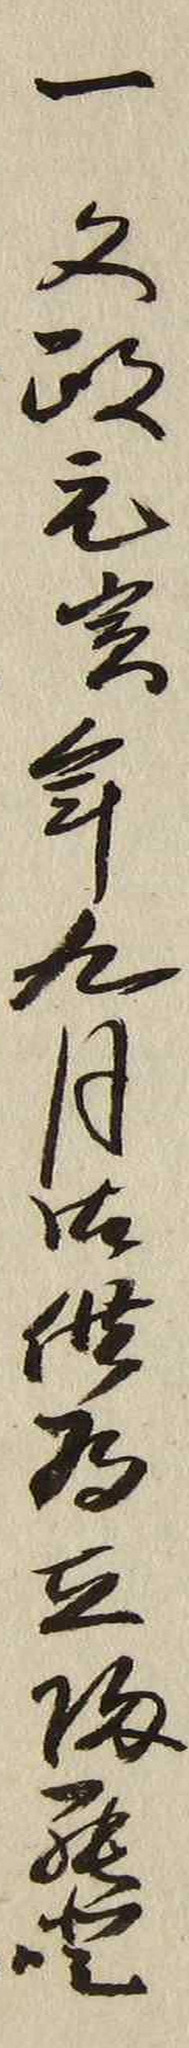一文政元寅年九月御供為立帰罷登候
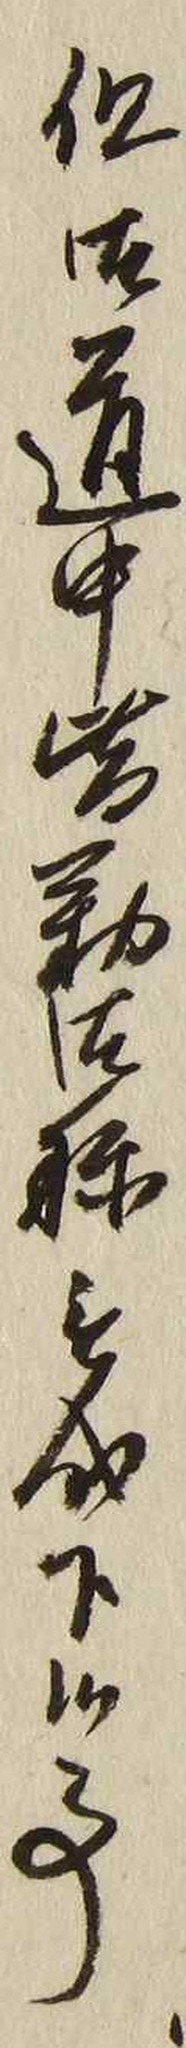但御道中皆勤御称被成下候事

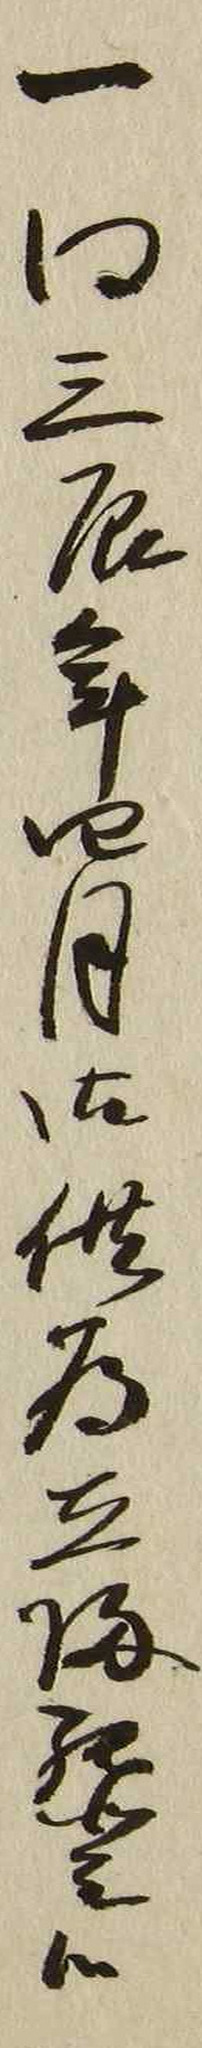一同三辰年四月御供為立帰罷登候
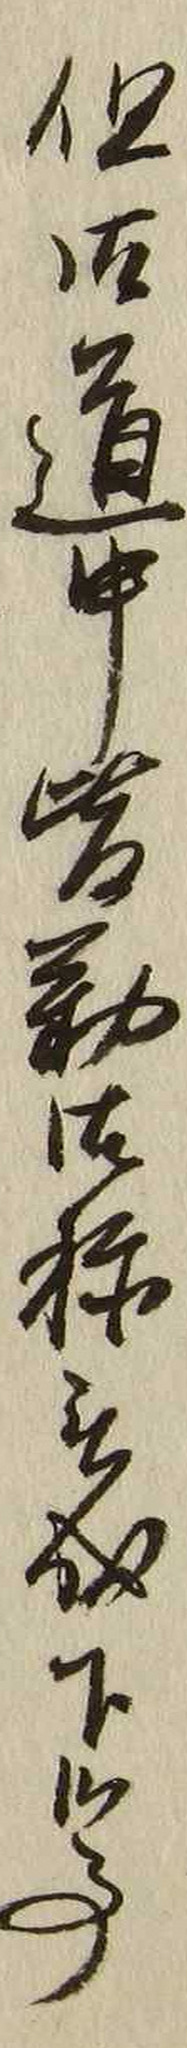但御道中皆勤御称被成下候事
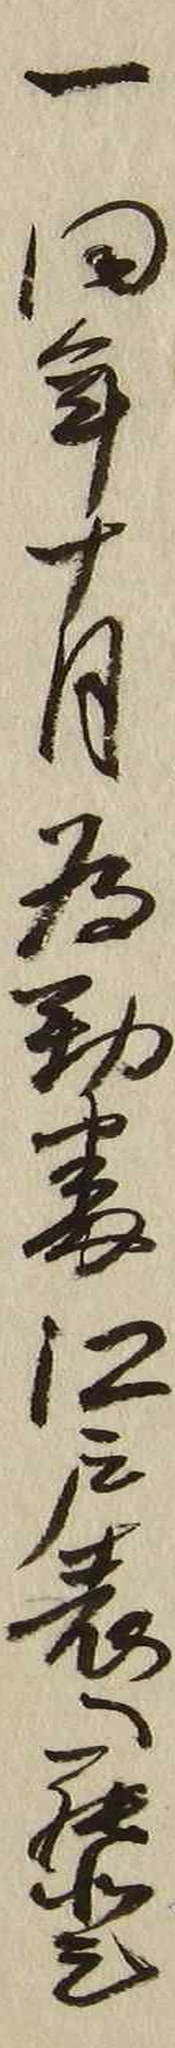一同年十月為勤番江戸表へ罷登
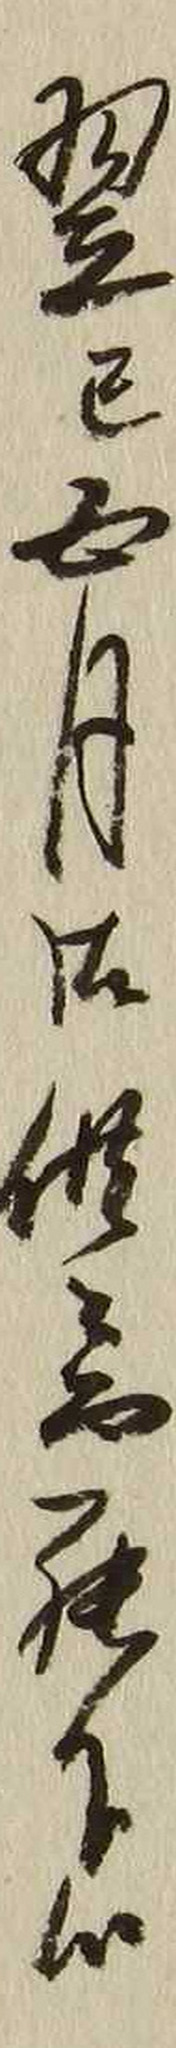翌巳五月御供ニ而罷下候
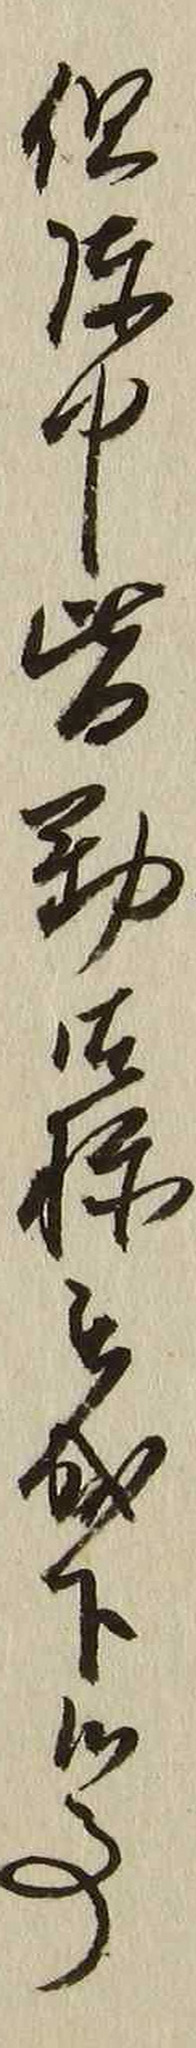但陣中皆勤御称被成下候事
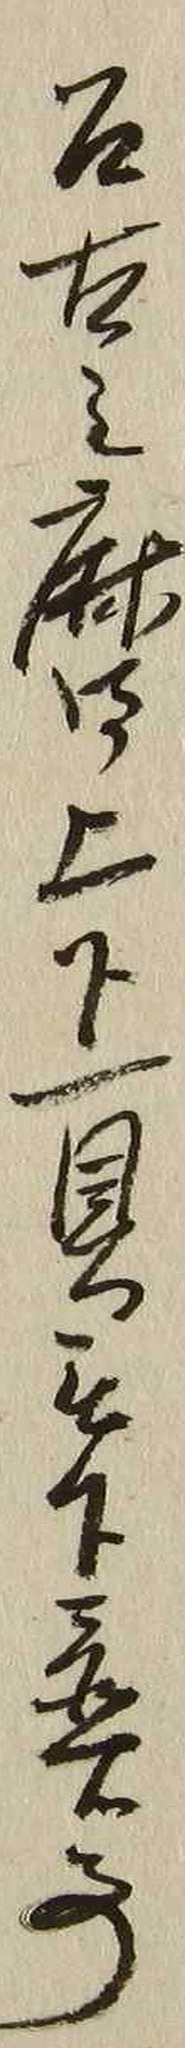召古之麻御上下一具被下置候事
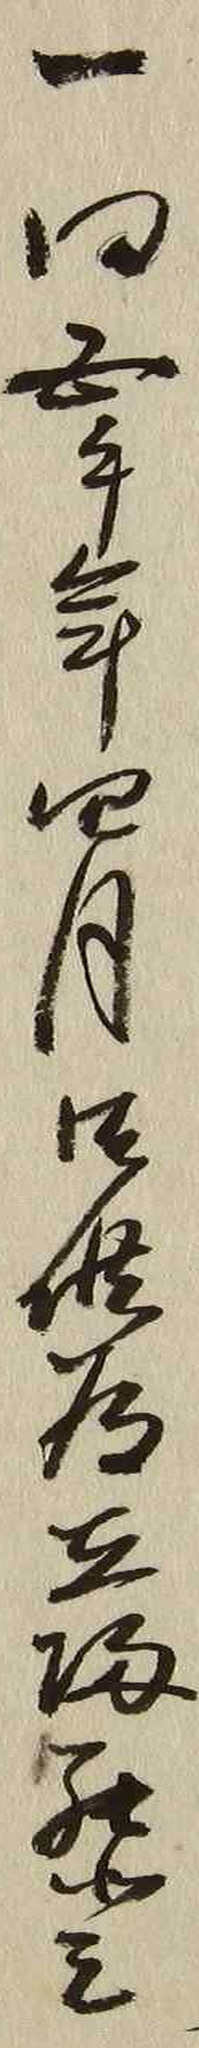一同五午年四月御供為立帰罷登
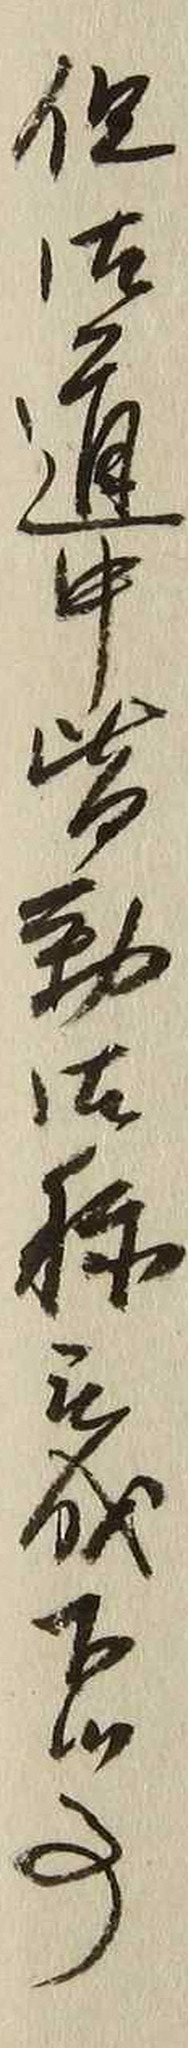但御道中皆勤御称被成下候事
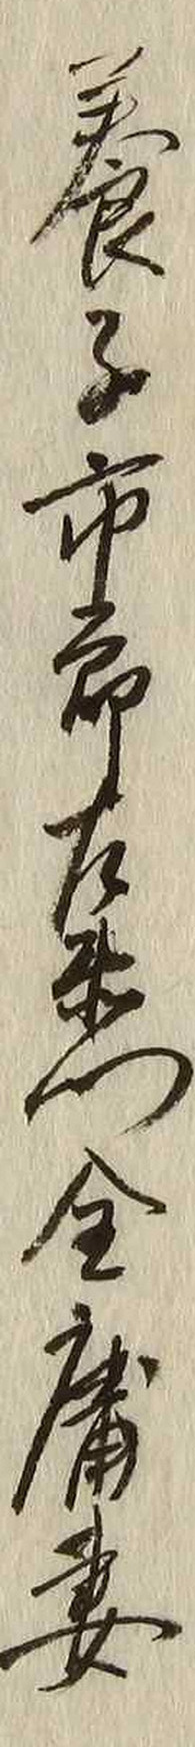女養子市郎左衛門全庸妻
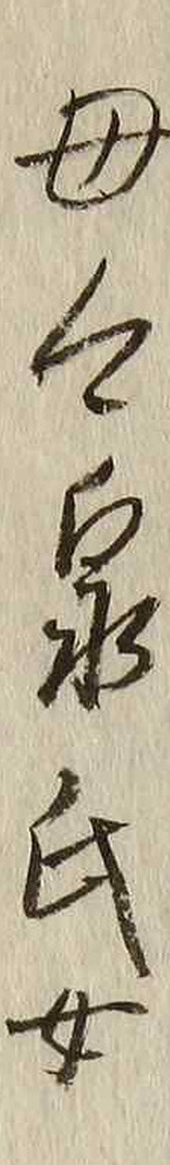母今泉氏女
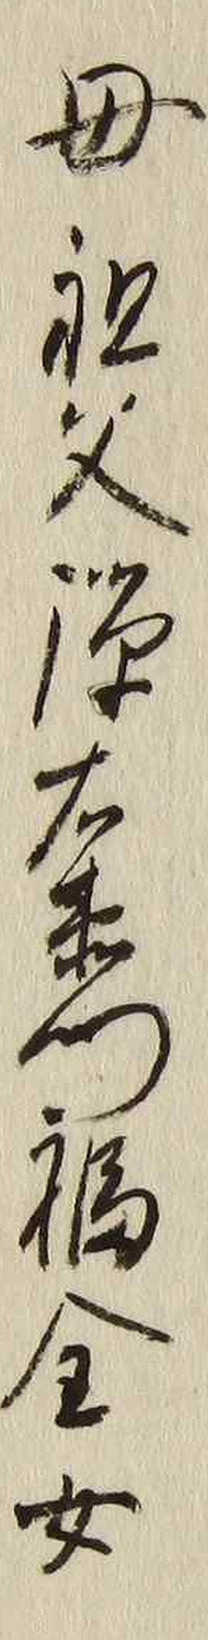母祖父弾右衛門福全女
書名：諸士系譜　巻之346　も之部2
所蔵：会津若松市立会津図書館
